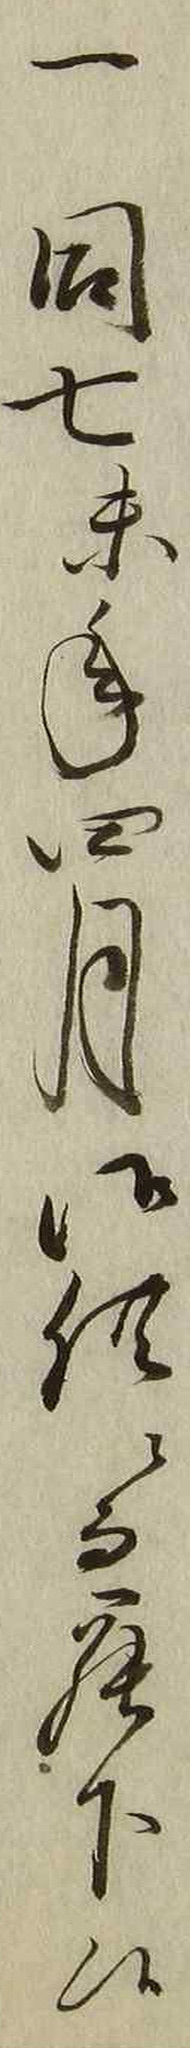一同七未年四月御供ニ而罷下候
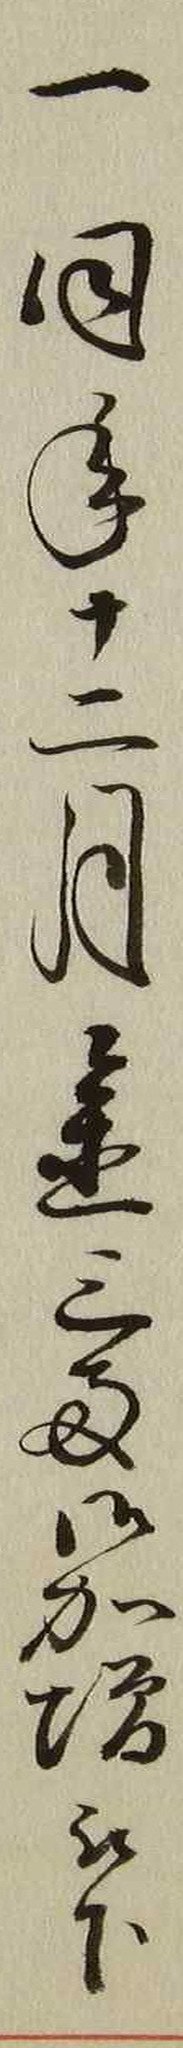一同年十二月金三両御加増被下
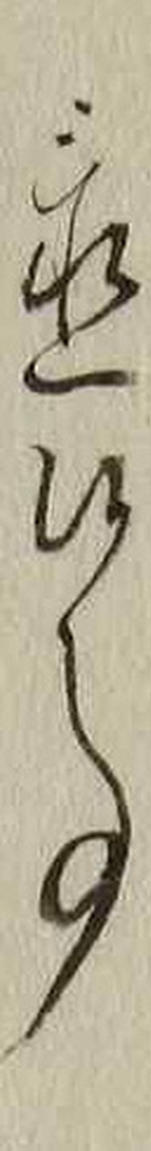置候事
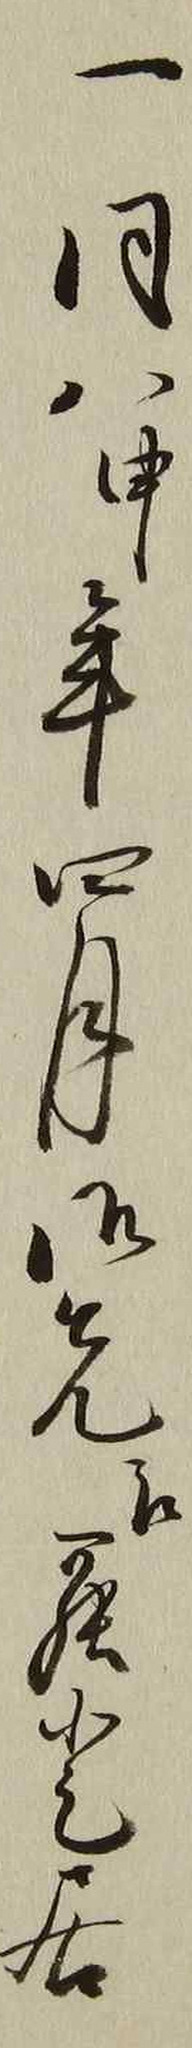一同八申年四月御先江罷登居
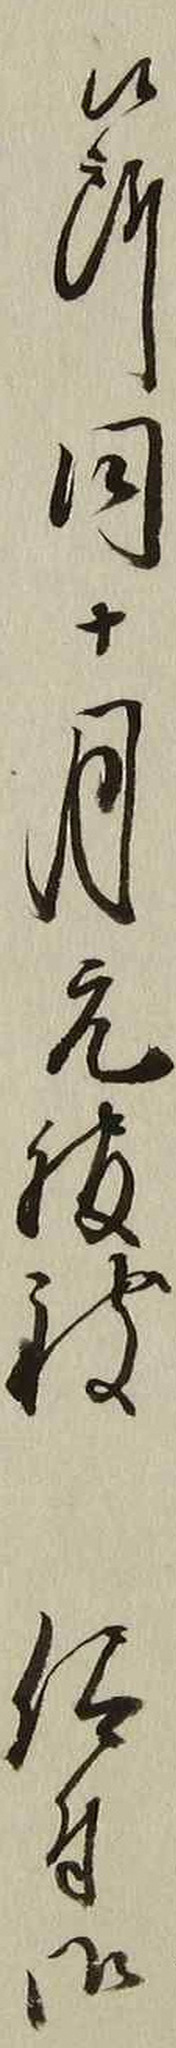候所同十月元服被仰付御
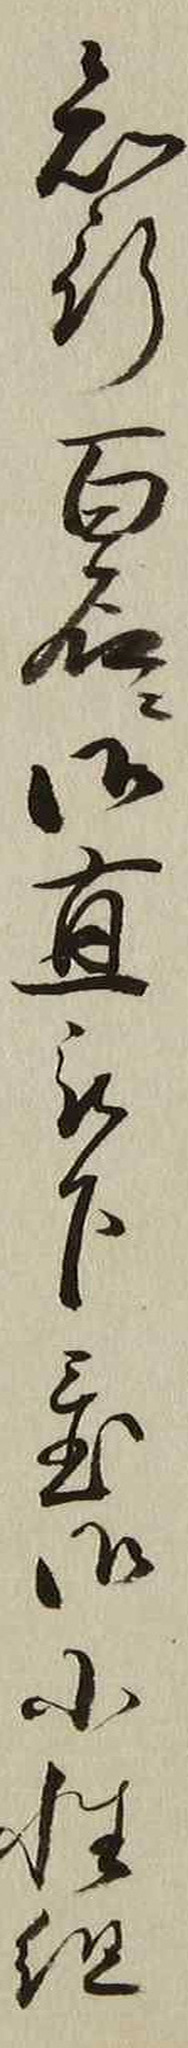知行百石ニ御直被下置候小性組
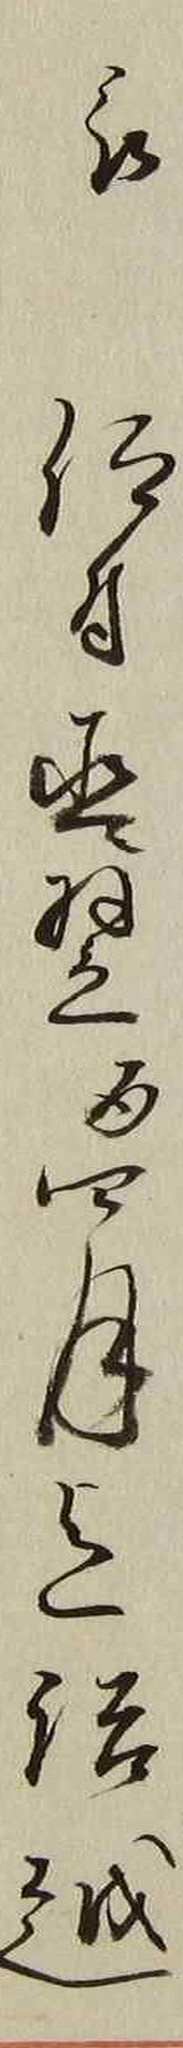被仰付直ニ翌酉四月迄詰越
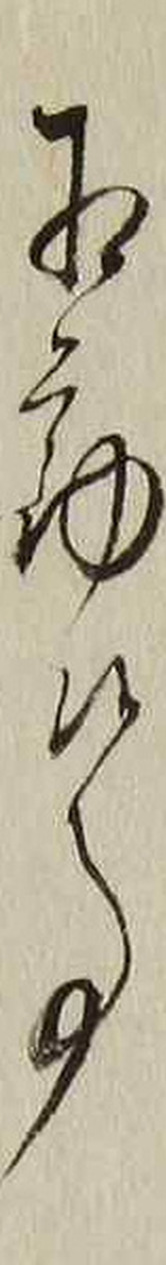相勤候事
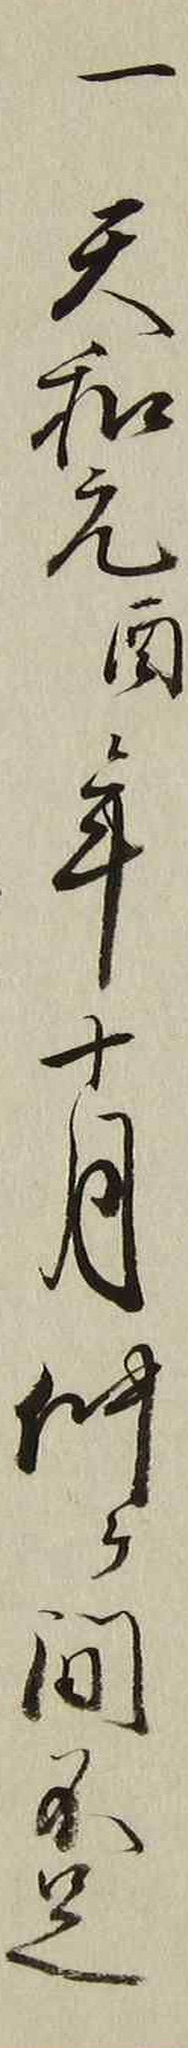一天和元酉年十月仲ケ間不足
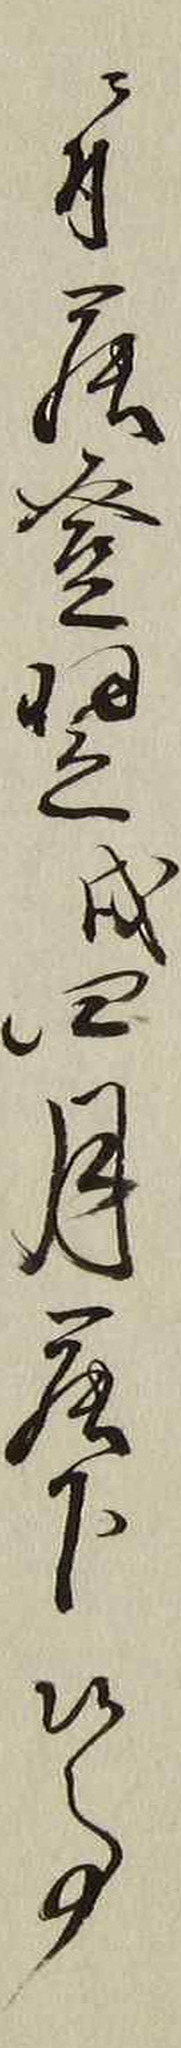ニ付罷登翌戌四月罷下候事
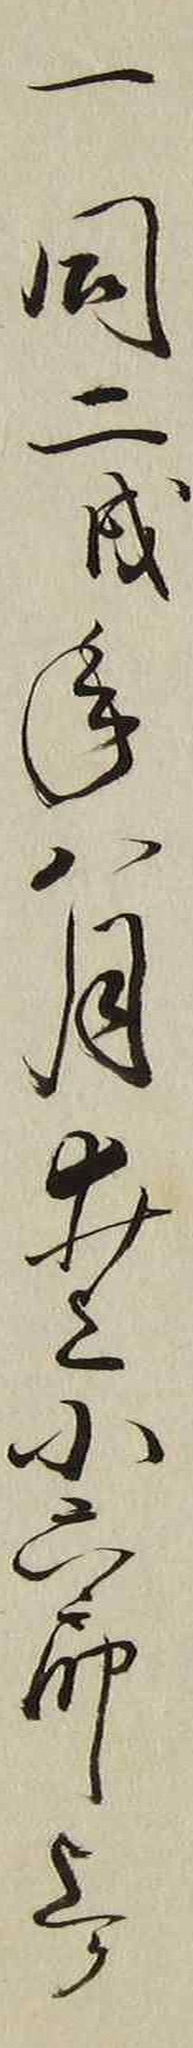一同二戌年八月井上小六郎上ケ
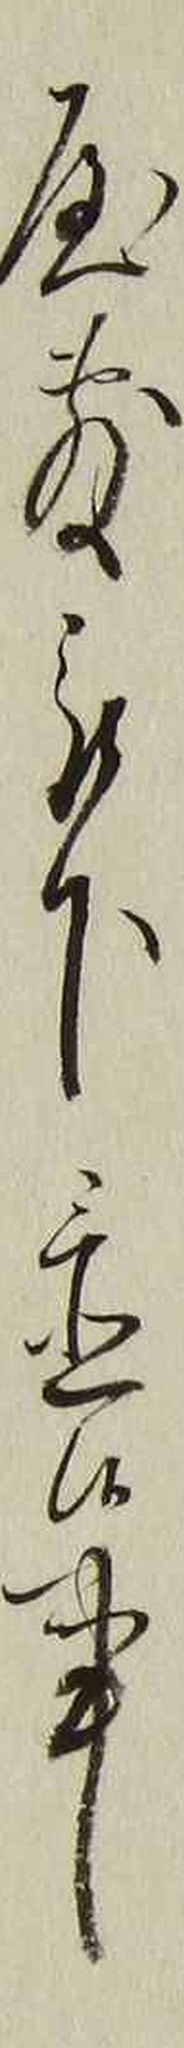屋敷被下置候事
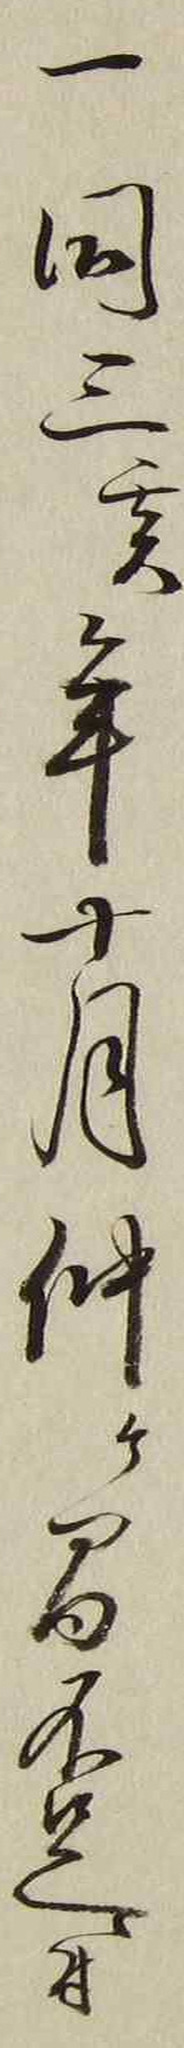一同三亥年十月仲ケ間不足ニ付

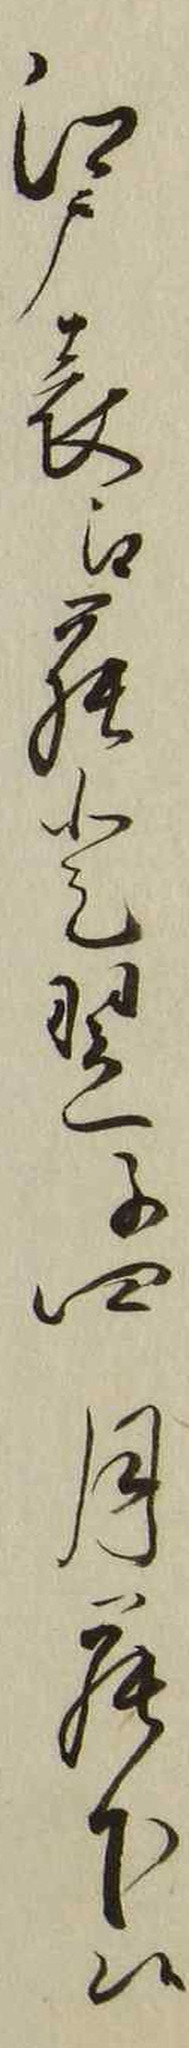江戸表江罷登翌子四月罷下候
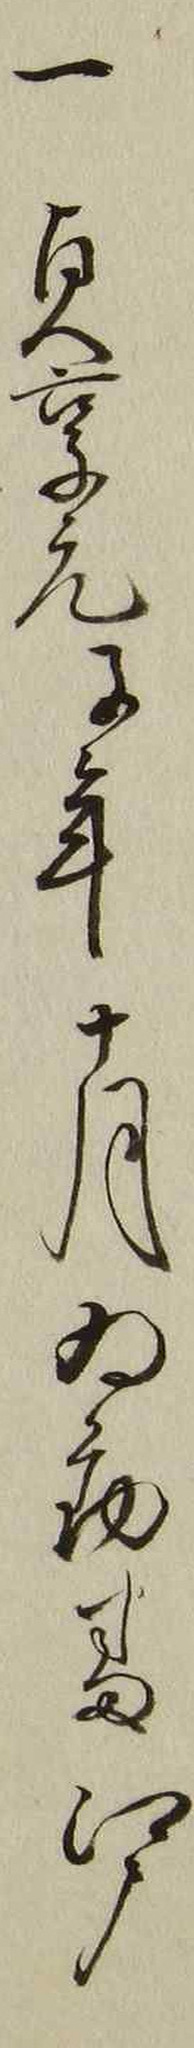一貞享元子年十月為勤番江戸
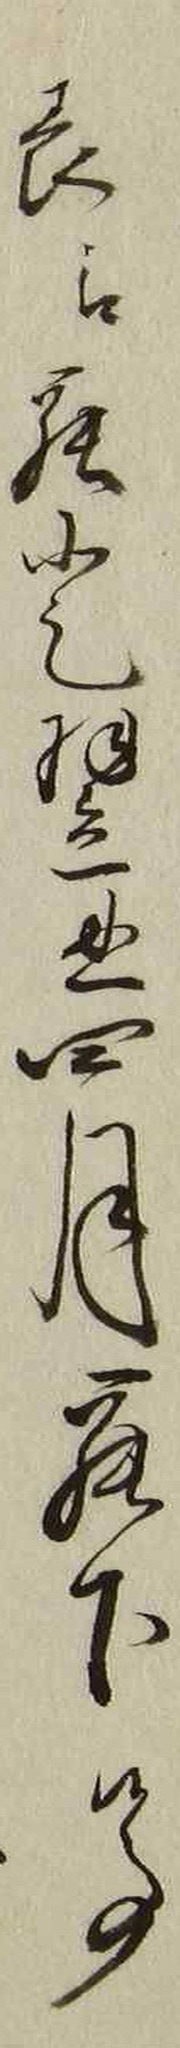表江被罷登翌丑四月罷下候事
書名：諸士系譜　巻之2　い之部2
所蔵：会津若松市立会津図書館
